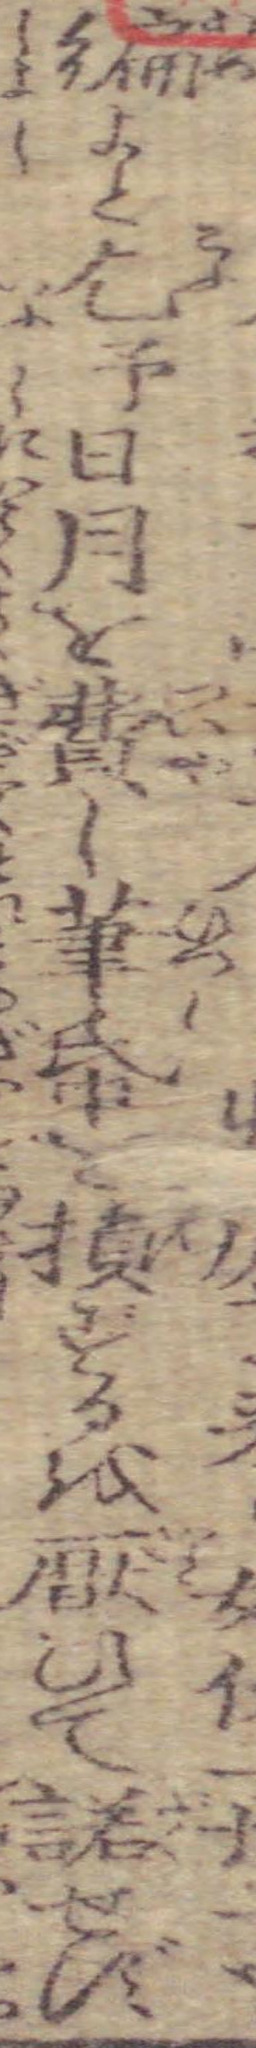編よと乞予日月を費し筆紙を損ずるを厭ひて諾せず
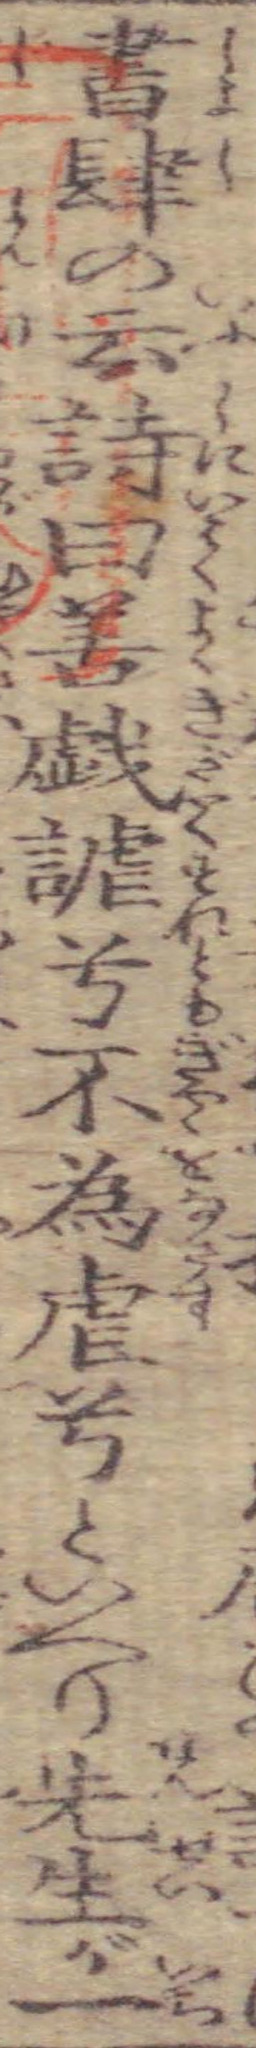書肆の云詩曰善戯謔兮不為虐兮といへり先生が一
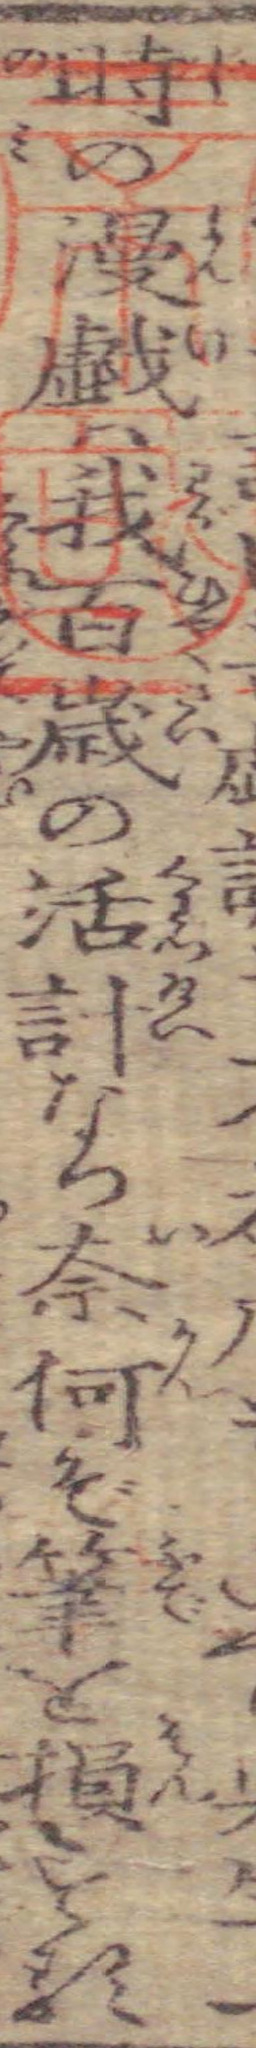時の漫戯は我百歳の活計なり奈何ぞ筆を損する
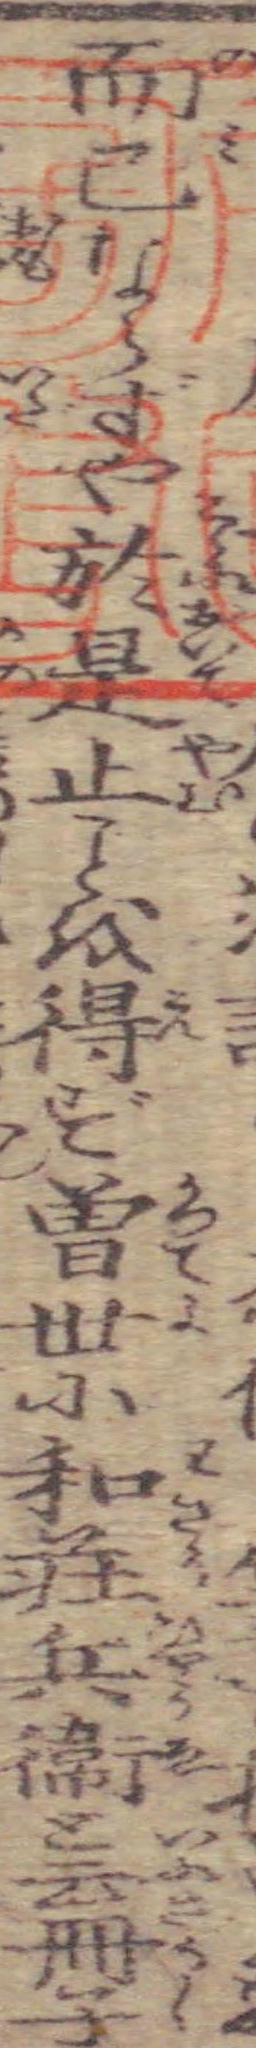而已ならずや於是止ことを得ず曽世に和荘兵衛と云冊子
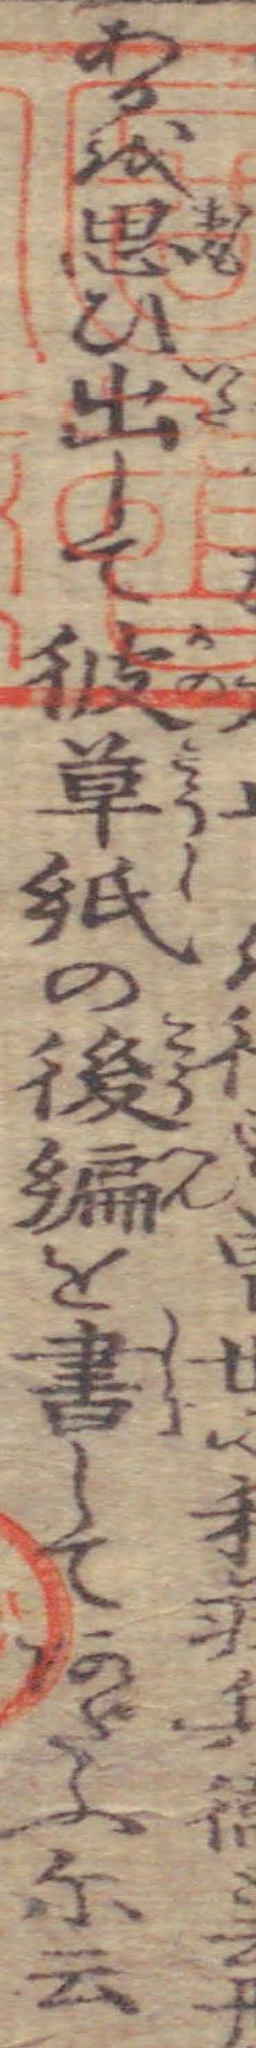あるを思ひ出して彼草紙の後編を書してあたふ尓云
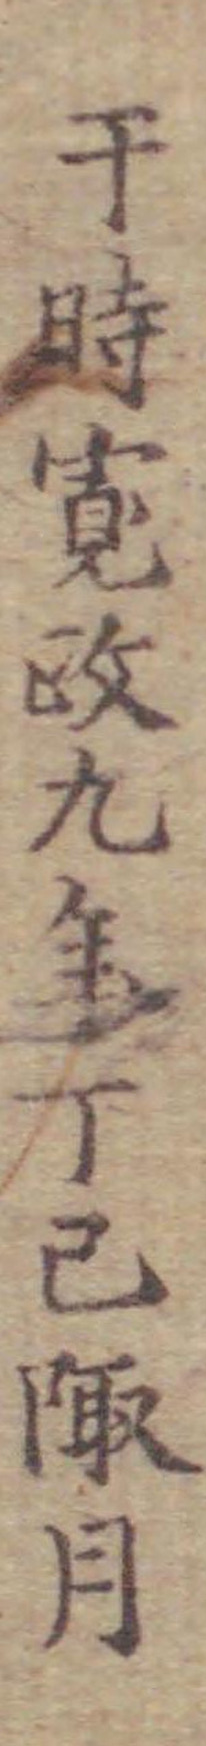于時寛政九年丁巳陬月
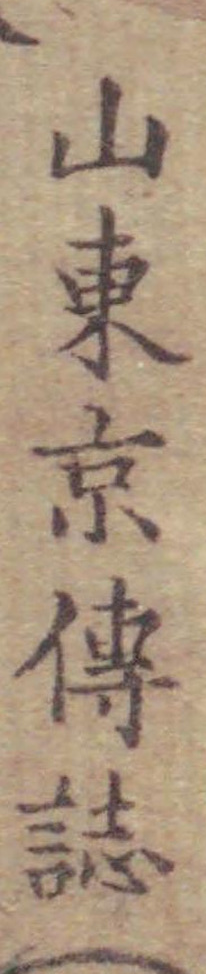山東京伝誌
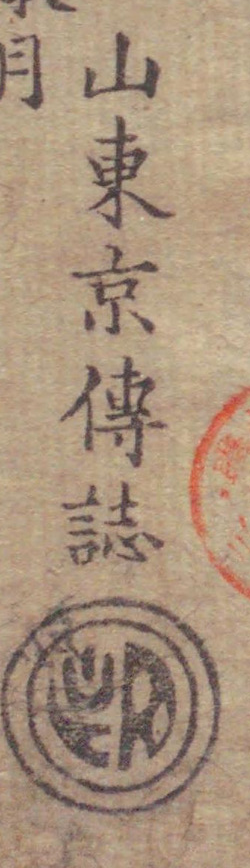山東京伝誌

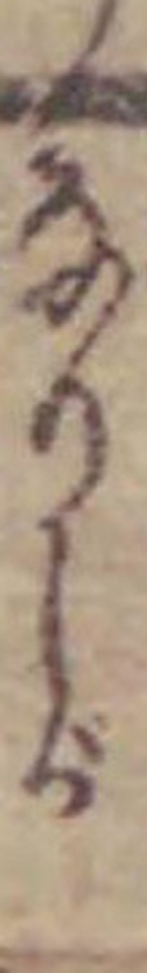なりしが
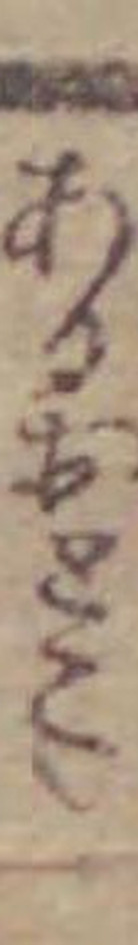あるおとこ
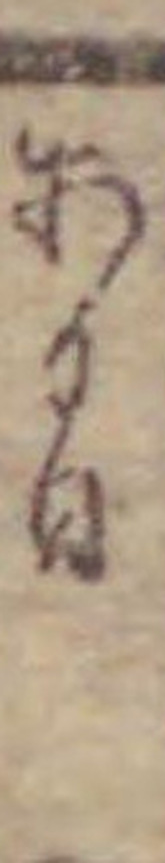ある日
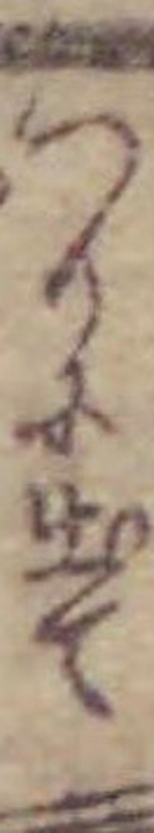つりに出て
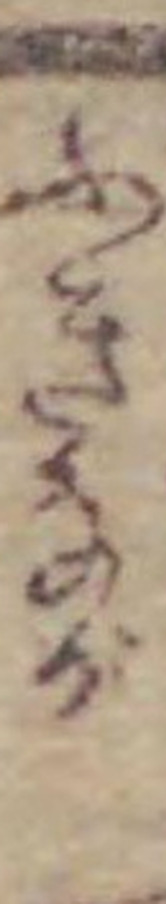ふきなが
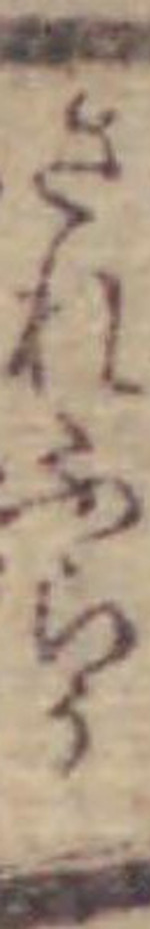されふらう
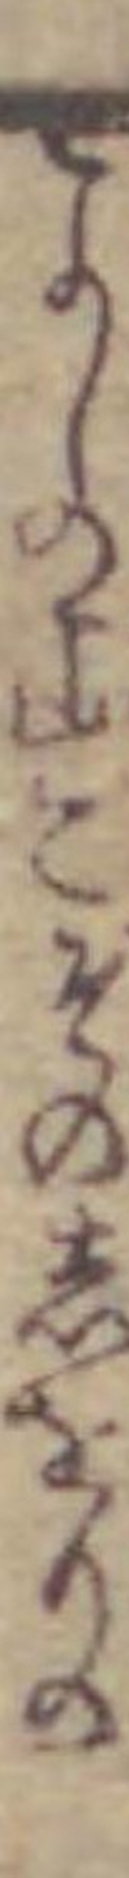よしの山こぞのしをりの
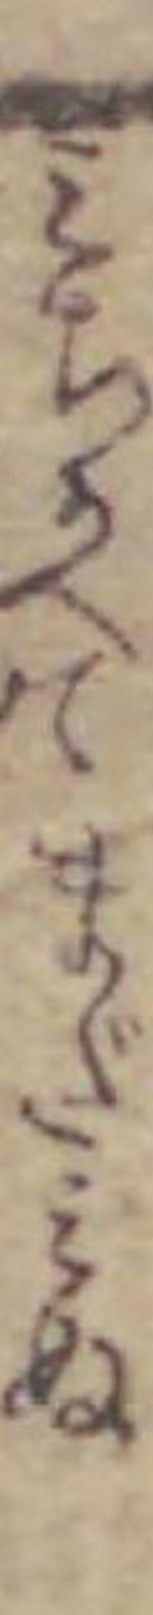みちかへてまだみぬ
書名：和荘兵衛後日話 : 3巻
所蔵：国立国会図書館 National Diet Library, JAPAN
